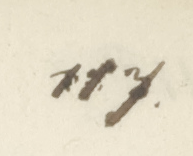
117
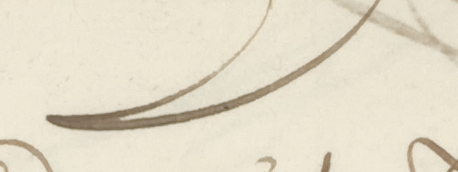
V
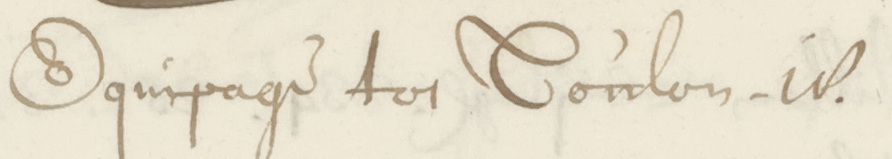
Equipage tot Toulon, 18.
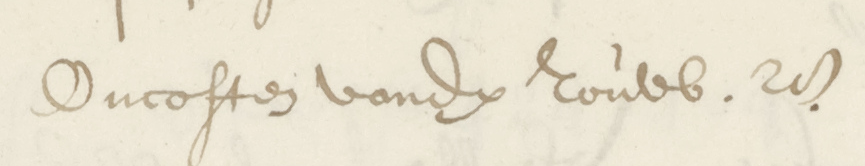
Oncosten vanden rouw, 28.
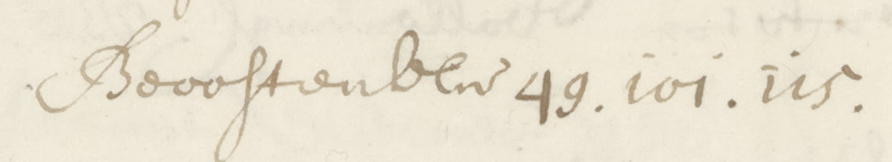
Beoostenblie 49, 101, 115.
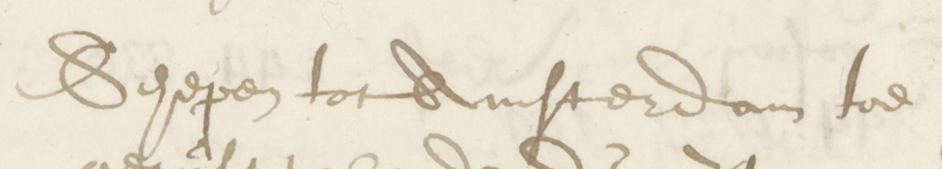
Schepen tot Amsterdam toe
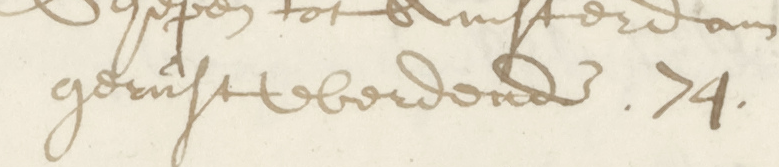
gerust werdende, 74.
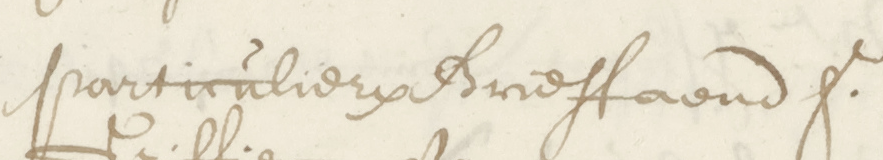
particulieren Brieff aend hr.
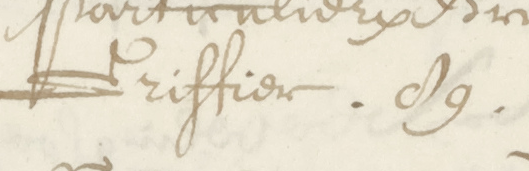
Griffier, 89.
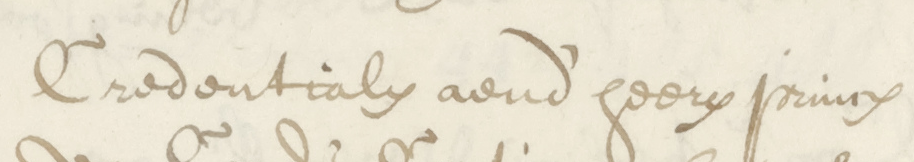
Credentialen aend' heeren princen
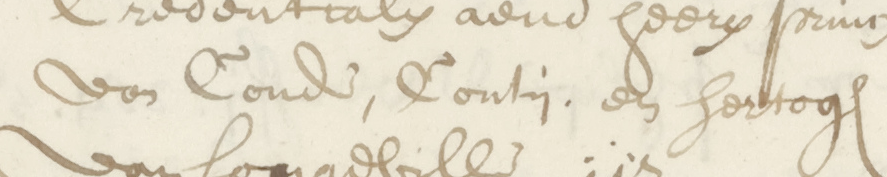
van Conde, Contij, en hertogh
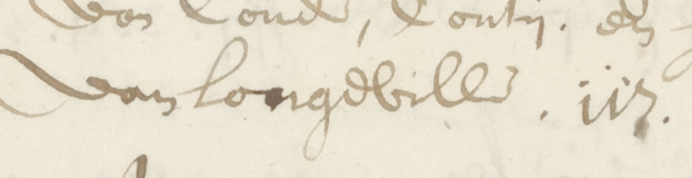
van longeville, 117.
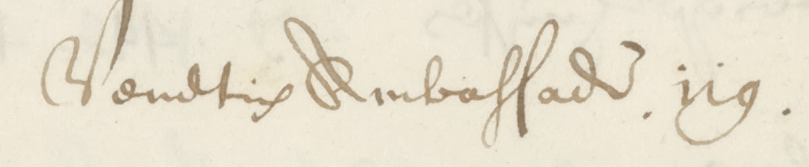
Venetien Ambassade, 119.
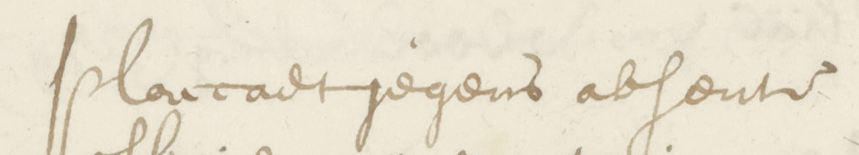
Placcaet jegens absente
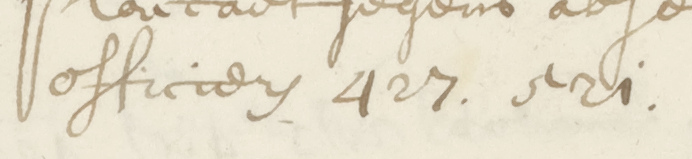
officieren, 427, 521.
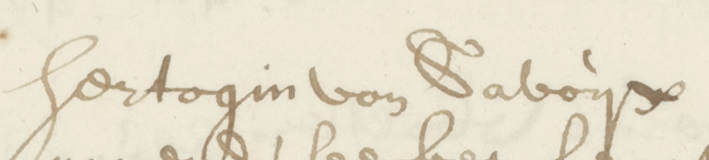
hertogin van Savoyen
